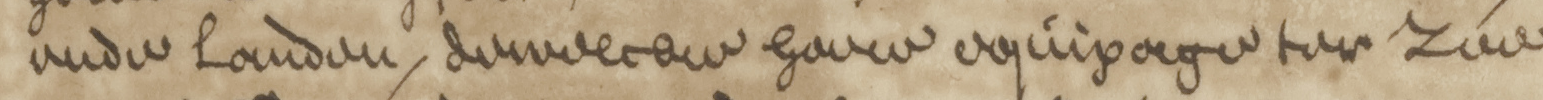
ende Landen, dewelcke haere equipage ter Zee
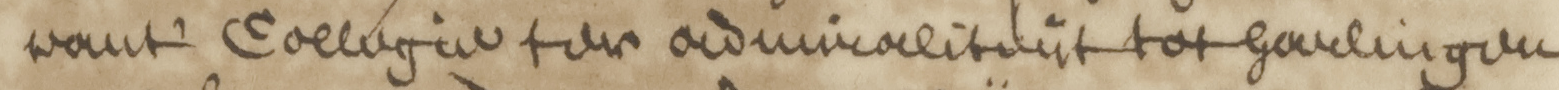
vant' Collegie ter admiraliteijt tot harlingen
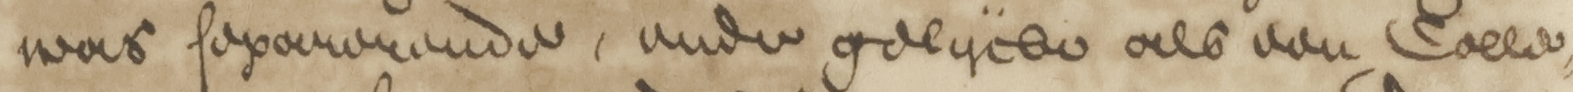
was separerende, ende gelijck als een Colle,,
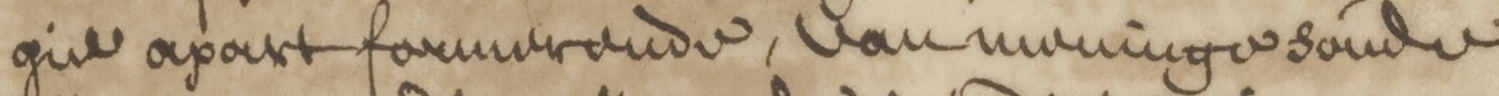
gie apart formerende, van meninge soude
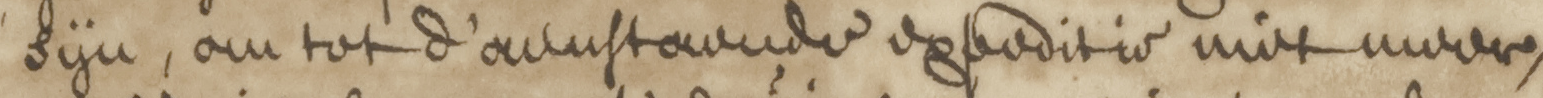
sijn, om tot d'aenstaende expeditie niet meer
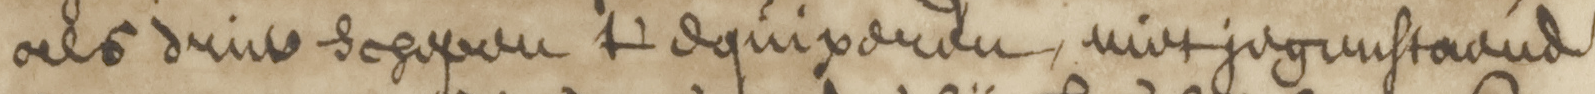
als drie schepen t'equiperen, niet jegenstaende
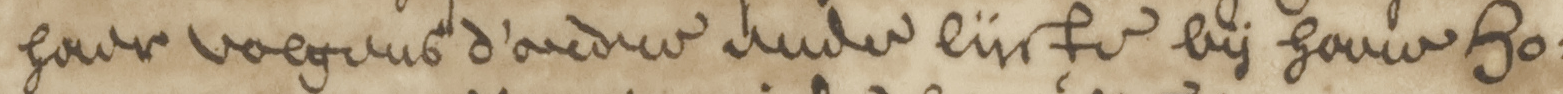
haer volgens d'ordre ende lijste bij hare Ho:
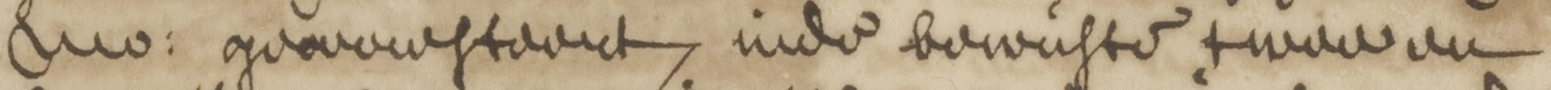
Mo: gearresteert, inde bewuste tweede
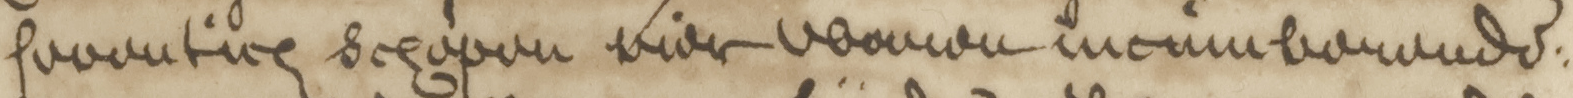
seventich schepen vier waren incumberende.
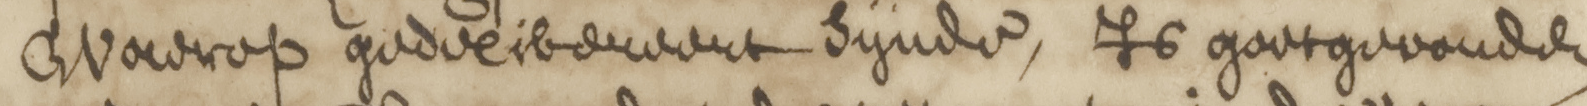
Waerop gedelibereert sijnde, Is goetgevonden
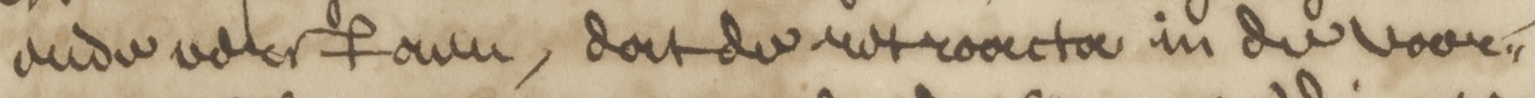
ende verstaen, dat de retroacta in de voor„
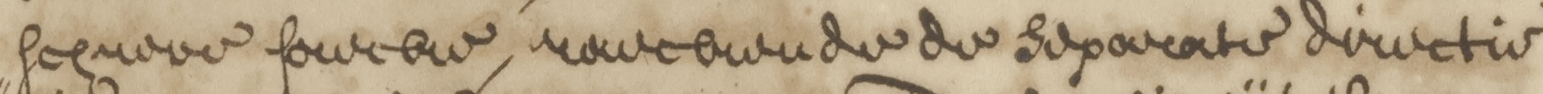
,,schreve saecke, raeckende de separate directie
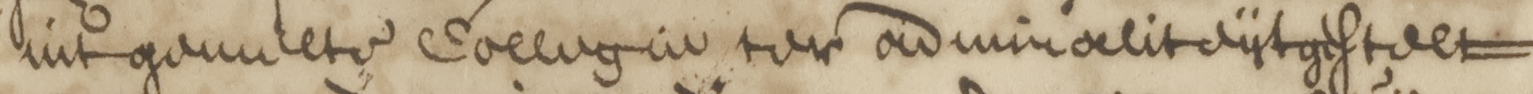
int gemelte Collegie ter admiraliteijt gestelt
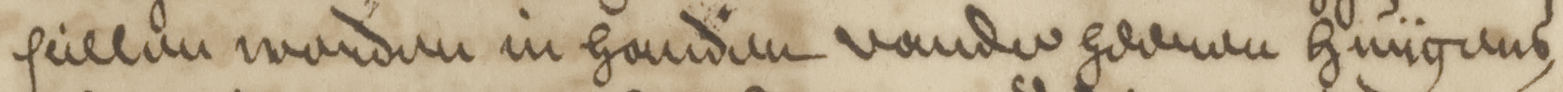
sullen werden in handen vande heeren huiigens,
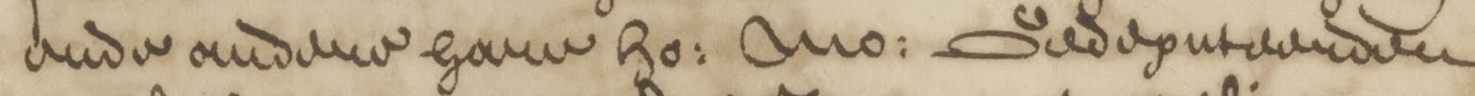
ende andere hare Ho:Mo: Gedeputeerden
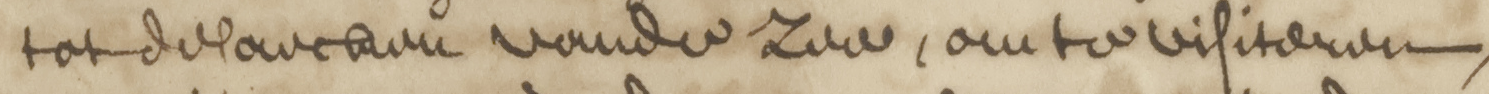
tot de saecken vande Zee, om te visiteren
